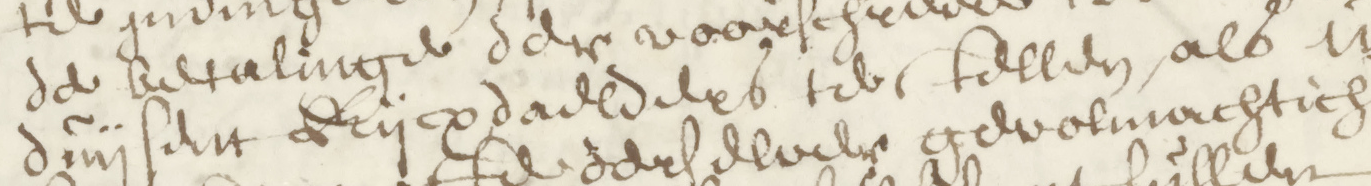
duijsent Rijcxdaelders te stellen, als U
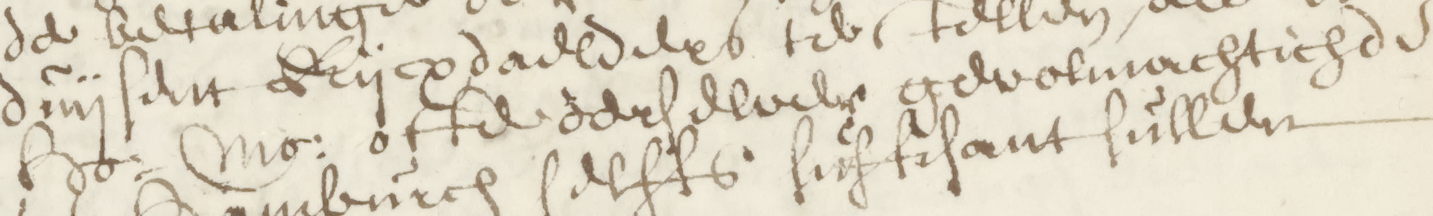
Ho:Mo: ofte derselver gevolmachtichde
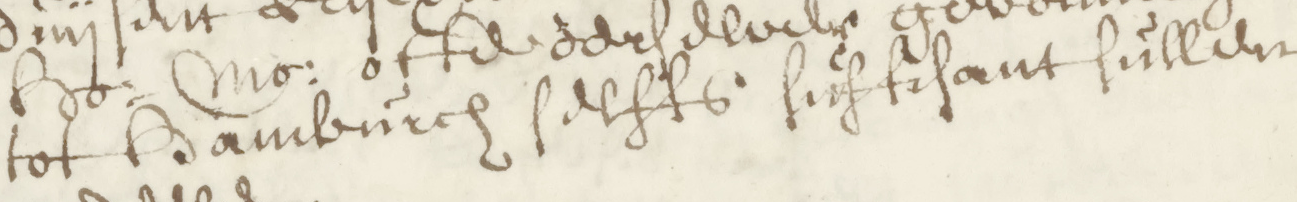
tot Hamburch selffs suffisant sullen
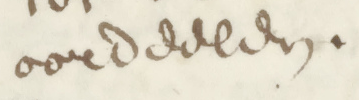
oordeelen.
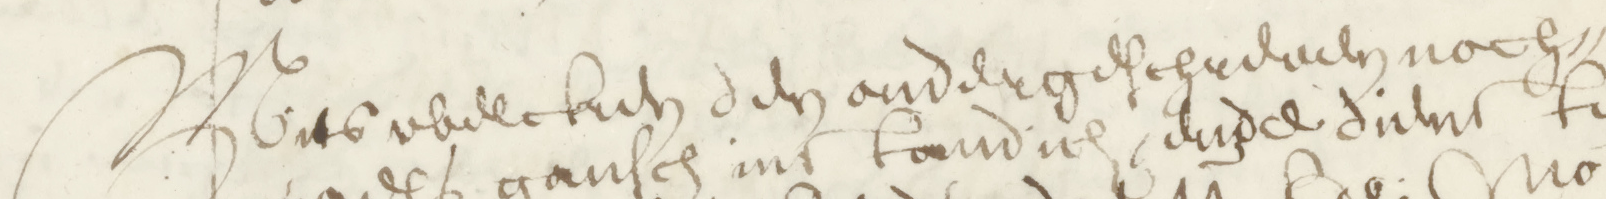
Mits welcken den ondergeschreven noch„
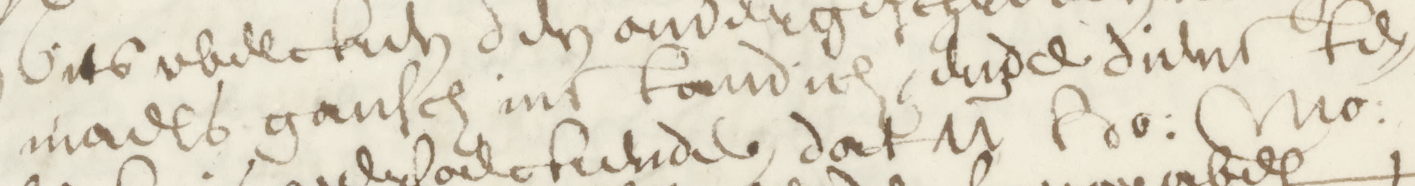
maels gansch instandich, ende dienste„
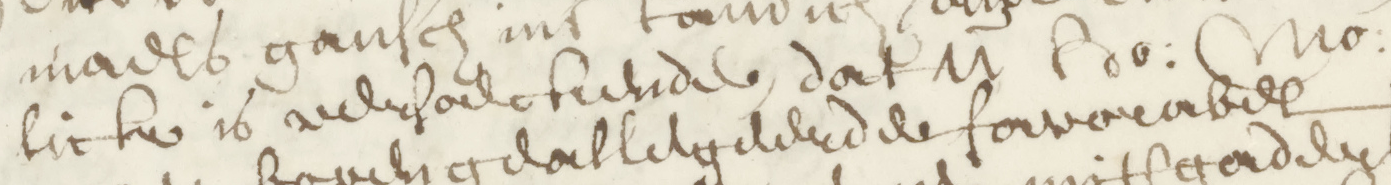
lick is versoeckende, dat U Ho:Mo:
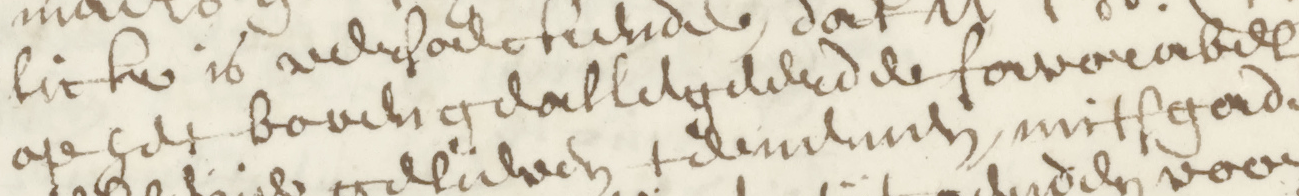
op het bovengeallegeerde favorabel
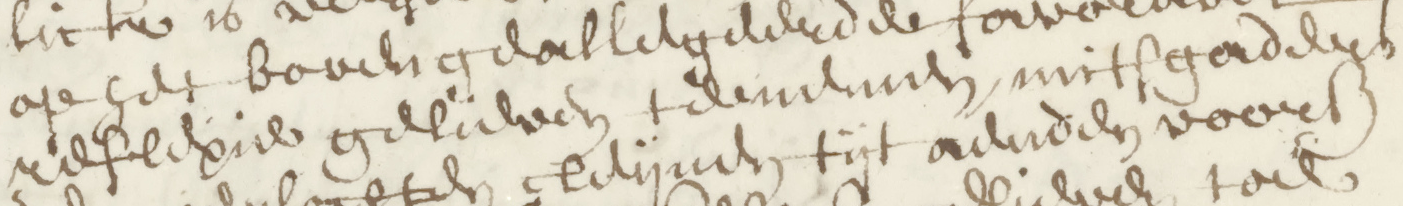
reflexie gelieven te nemen, mitsgaders
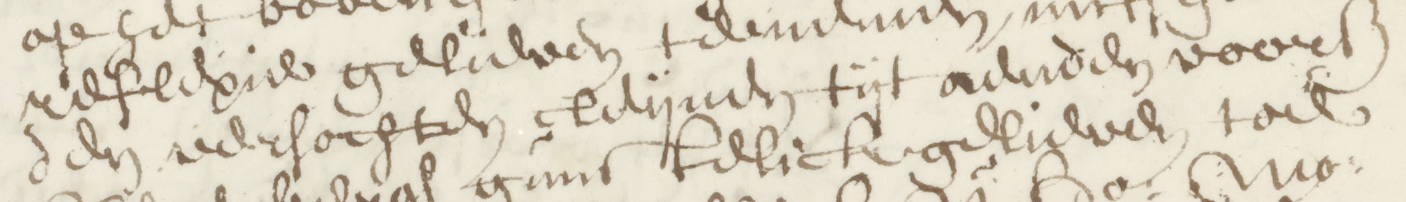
den versochten cleijnen tijt aenden voors
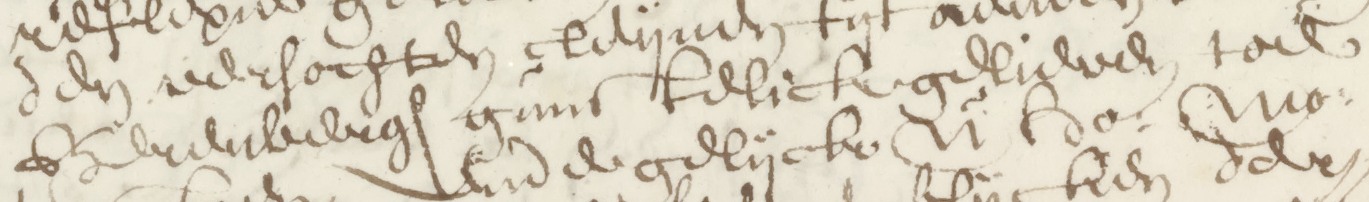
Berenbergh gunstelick gelieven toe
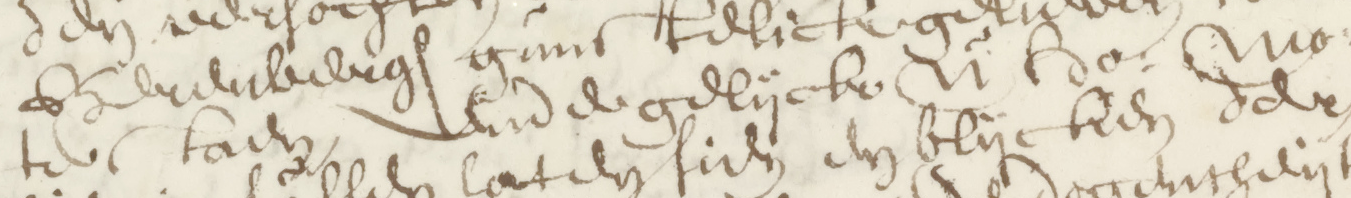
te staen, ende gelijck U Ho:Mo:
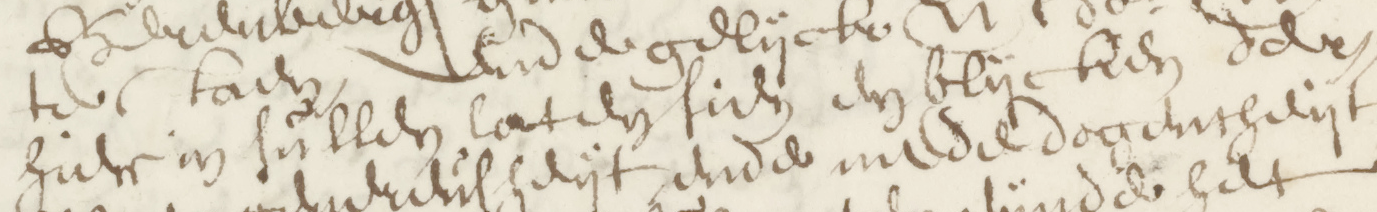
hier in sullen laten sien en blijcken der„
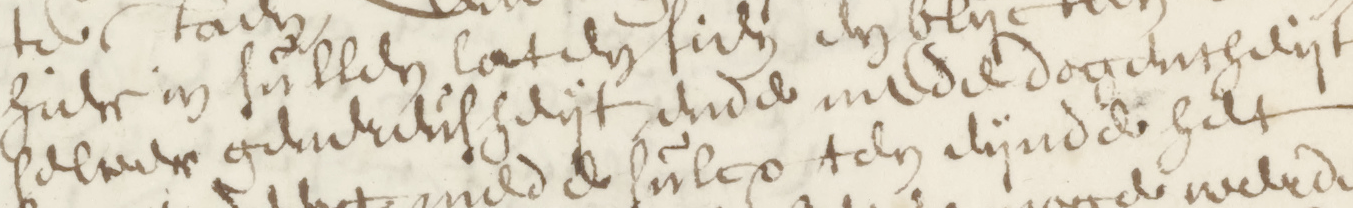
selver genereusheijt ende mededogentheijt,
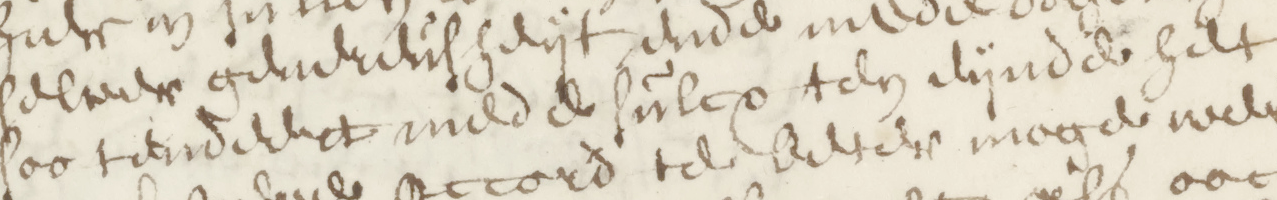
soo tendeert mede sulcx ten eijnde het
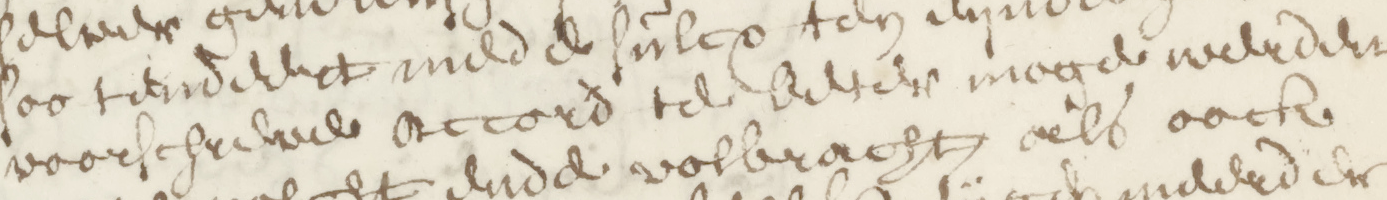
voorschreve Accord te beter moge werden
